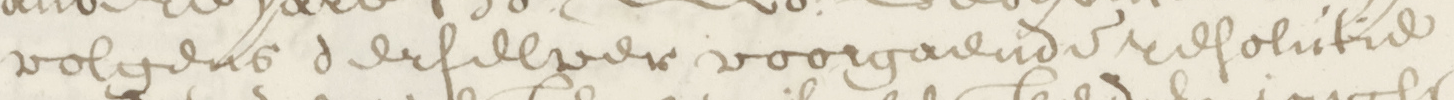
volgens derselver voorgaende resolutie
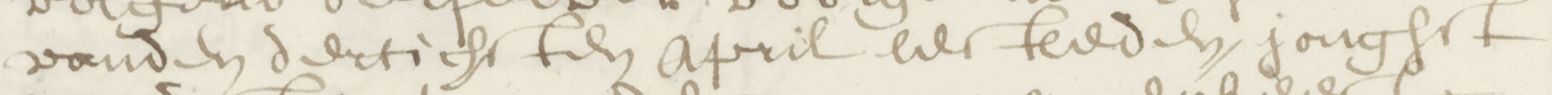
vanden dertichsten april lestleden, jonghst
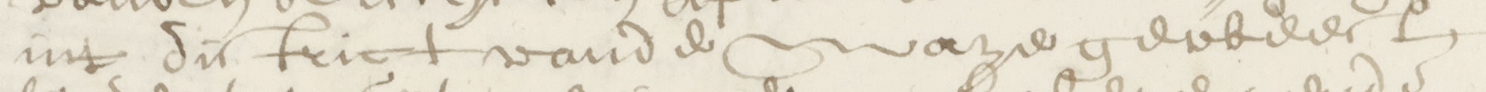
int district vande Maze geweest
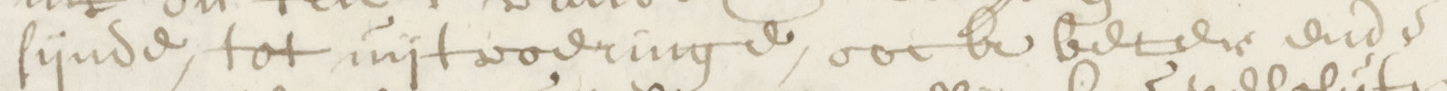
sijnde, tot uijtvoeringe, oock beter ende
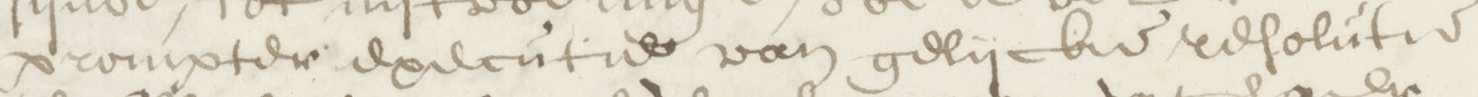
prompter executie van gelijcke resolutie
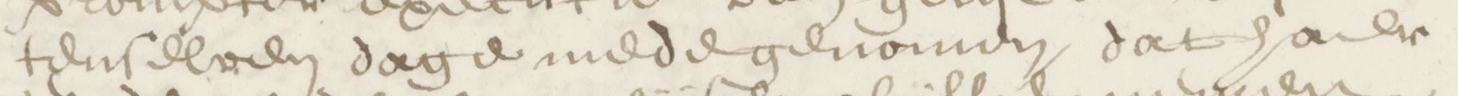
tenselven dage mede genomen, dat haer
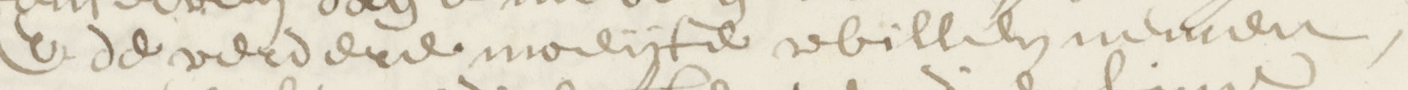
E. de verdere moeijte willen nemen,
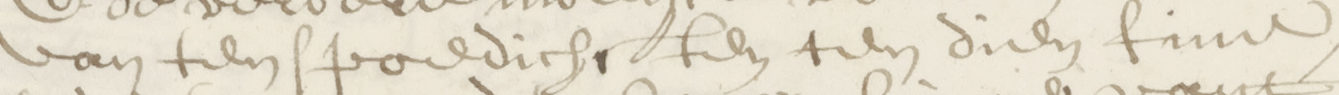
van ten spoedichsten ten dien fine,
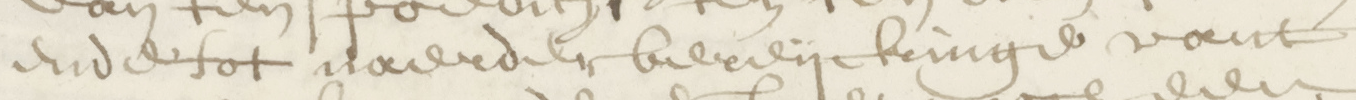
ende tot naerder bereijckinge vant
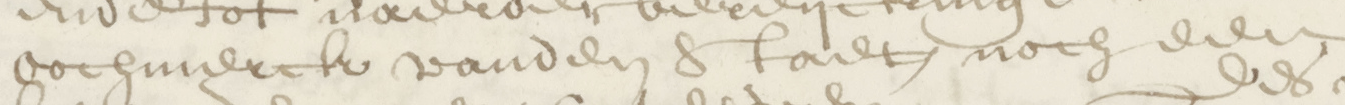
oochmerck vanden Staet, noch een
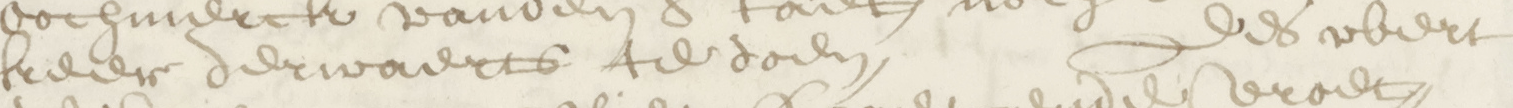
keer derwaerts te doen. Des wert
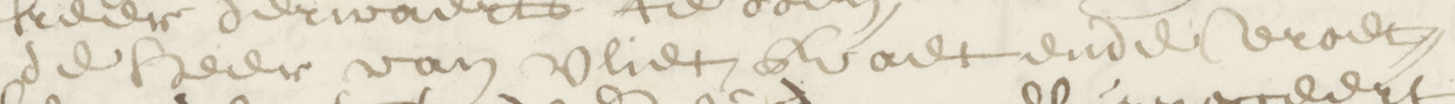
de Heer van Vliet, Raet ende vroet,,
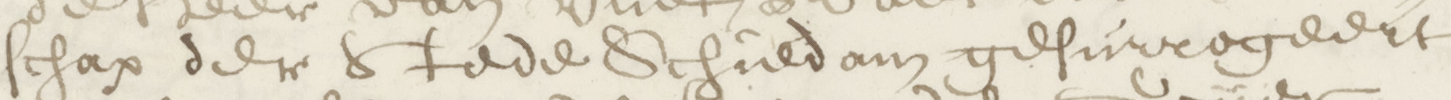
schap der stede Schiedam gesurrogeert
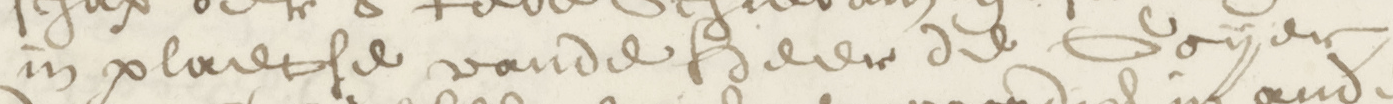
in plaetse vande Heer de Goijer,
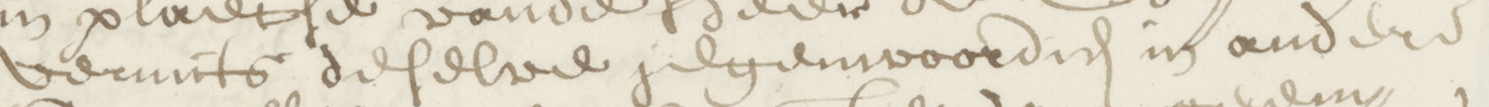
vermits deselve jegenwoordich in andere
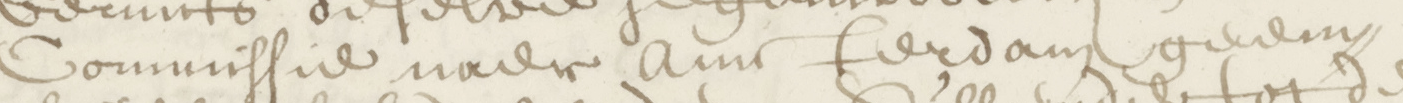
Commissie naer Amsterdam geem,,
